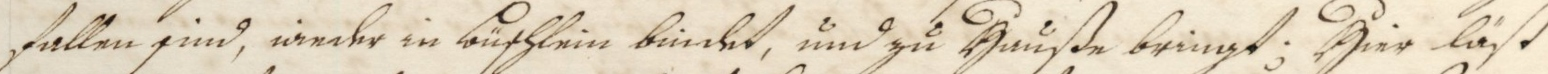fallen sind, wieder in Büschlein bindet, und zu Hauße bringt. Hier läßt
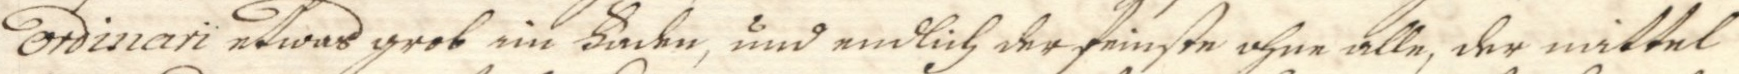ordinari etwas grob im Faden, und endlich der feinste ohne alle, der mittel
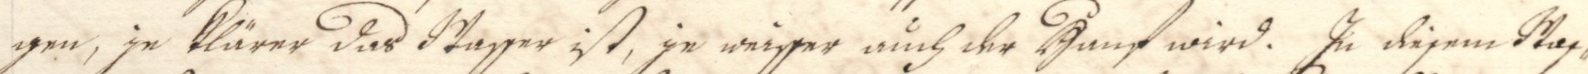gen, je klärer das Wasser ist, je weisser auch der Hanf wird. In diesem Was-
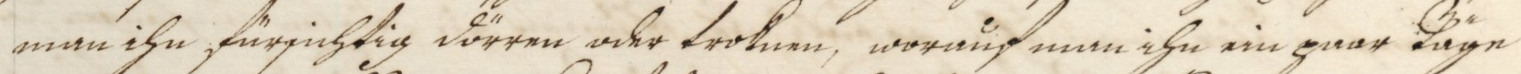man ihn fürsichtig dörren oder troknen, worauf man ihn ein paar Täge
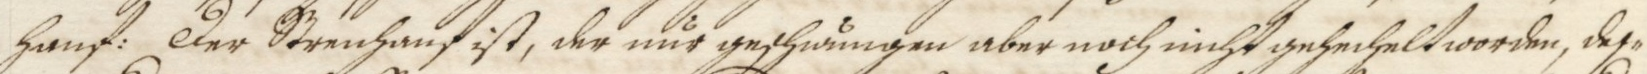hanf: Der Strenhanf ist, der nur geschwungen aber noch nicht gehechelt worden, des-
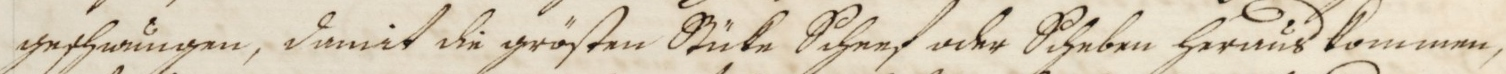geschwungen, damit die grösten Stüke Scheef oder Scheben heraus kommen,
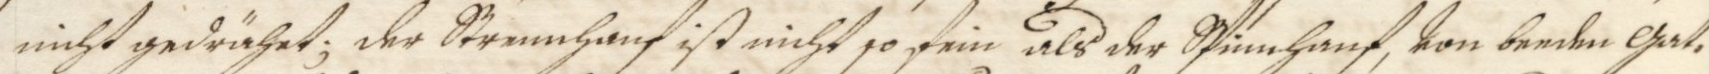nicht gedrähet; der Strennhanf ist nicht so fein als der Spinnhanf, von beeden Gat-
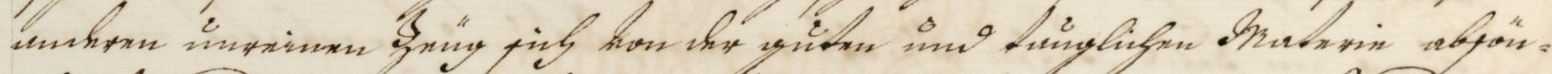anderen unreinen Zeüg sich von der guten und tauglichen Materie absön-
